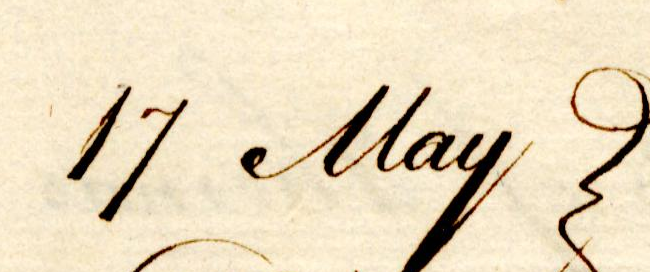17 May
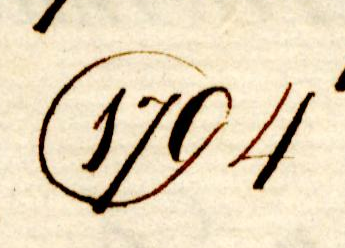1794
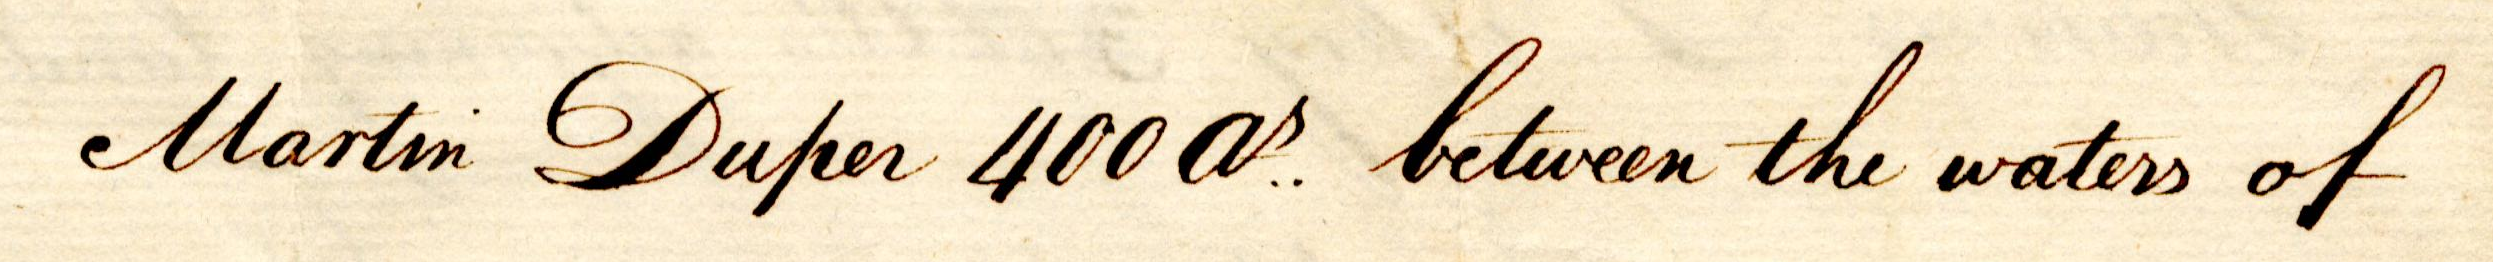Martin Duper 400 A^s. between the waters of
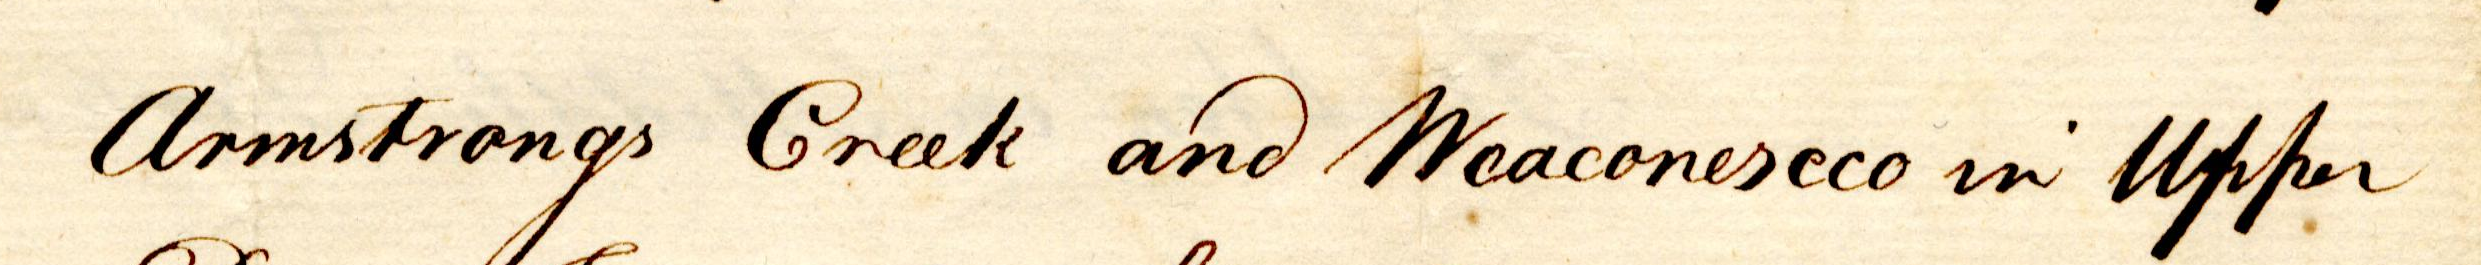Armstrongs Creek and Weaconeseco in Upper
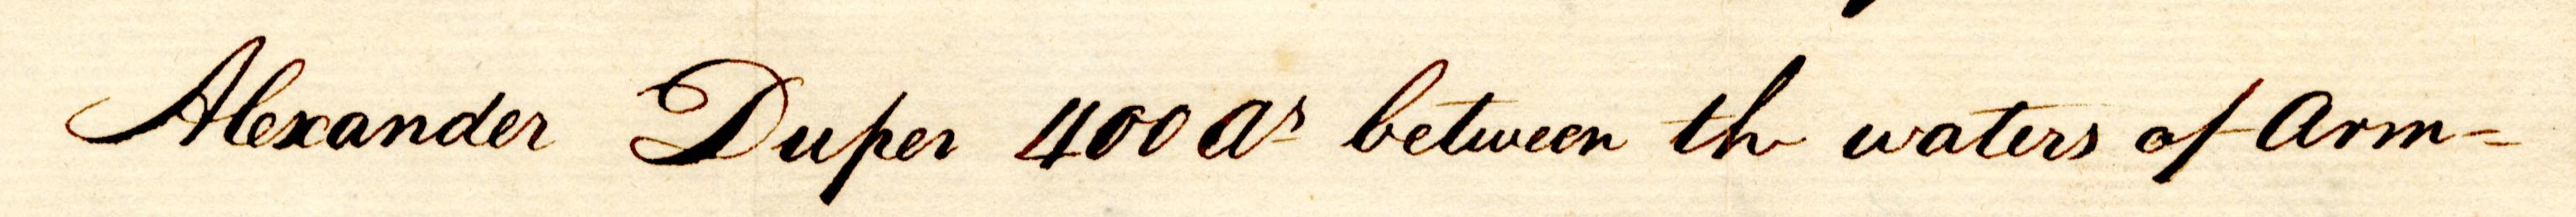Alexander Duper 400 A^s between the waters of Arm-
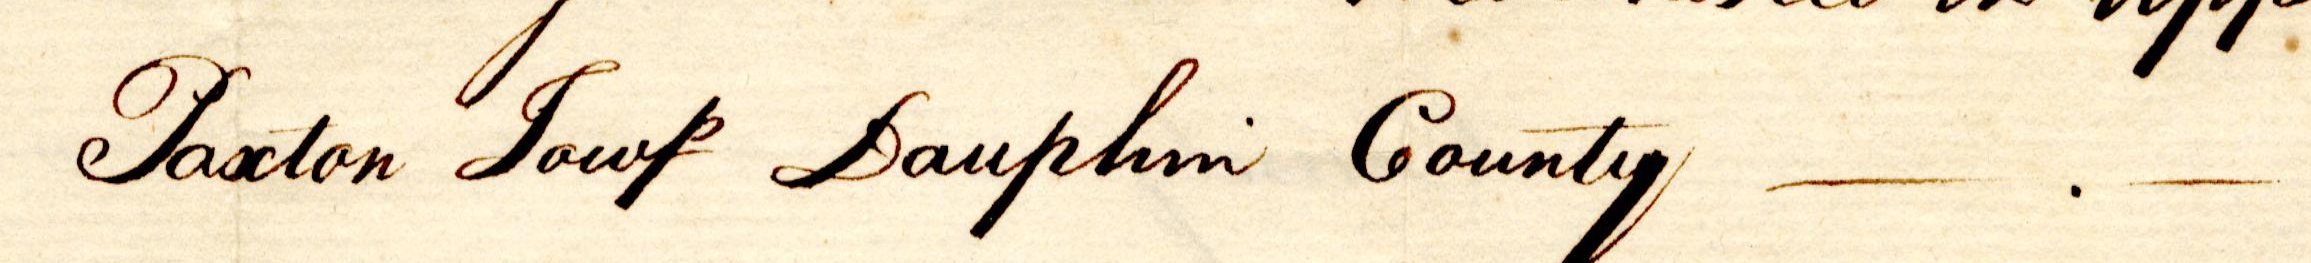Paxton Tow^p Dauphin County-.-
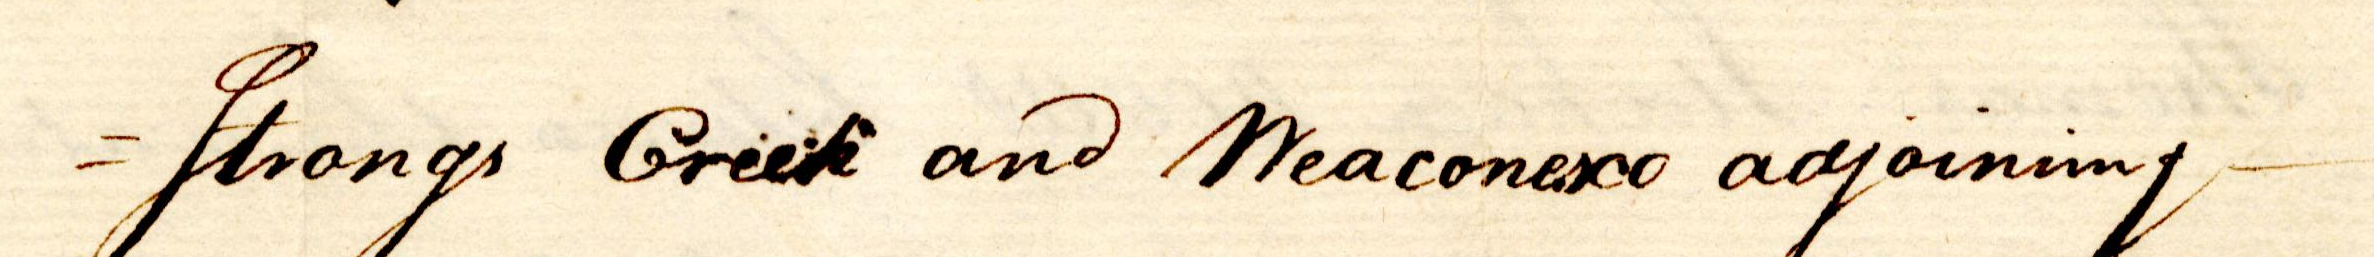-Strongs Creek and Weaconesco adjoining-
